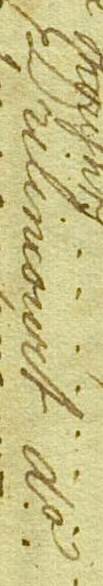Drilincourt d^o.
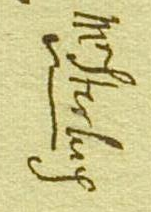M^r Sterling
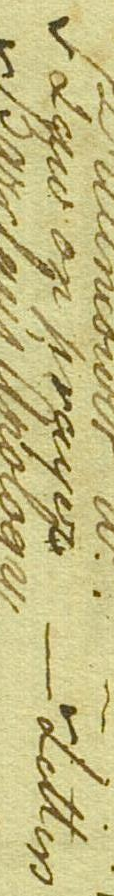- Law on prayers - Letters
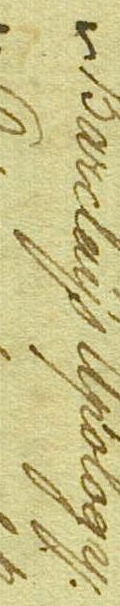- Barclays Apology.
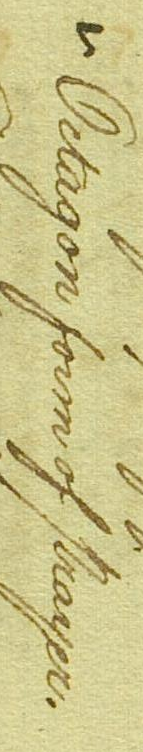- Octagon form of Prayer.
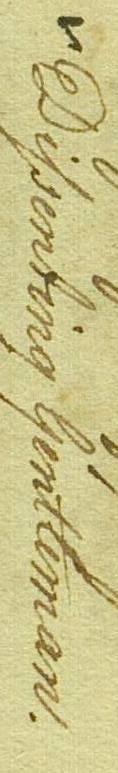- Dissenting Gentleman.
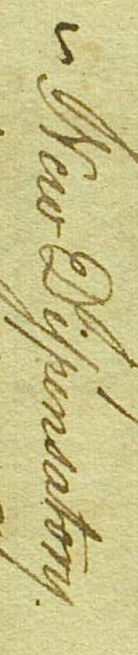- New Dispensatory.
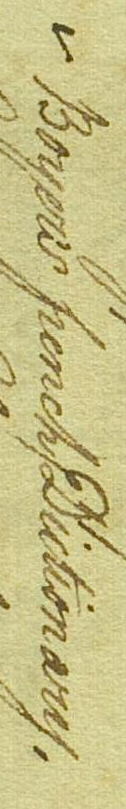- Boyer's french Dictionary.
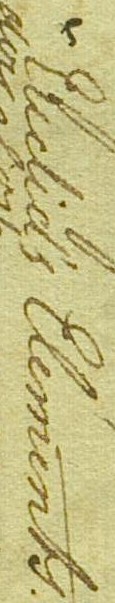- Euclid's Elements.
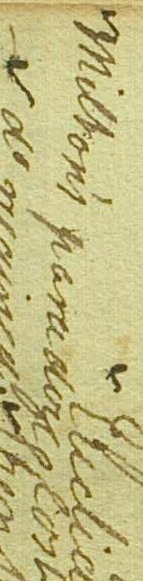Milton's paradise lost
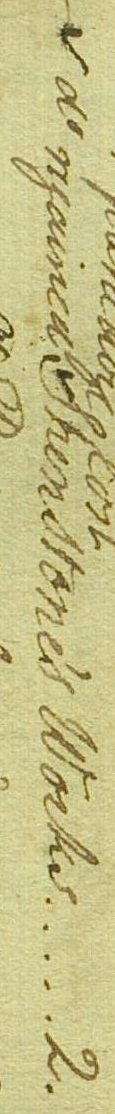- d^o regained Shenstone's Works.....2.
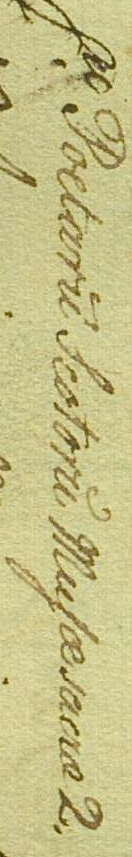[__] Poetaric Seotori Musae sacre 2.
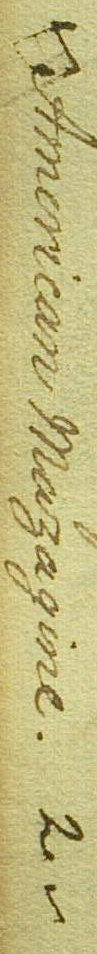- American Mazagine. 2 v
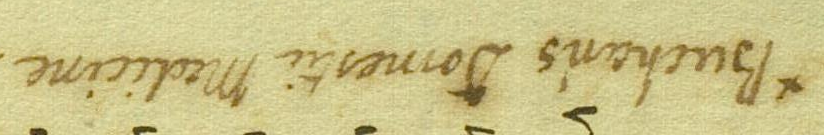*Buchan's Domestic Medicine.
